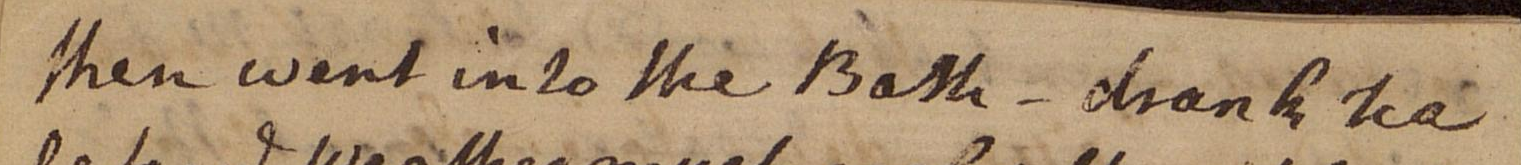then went into the Bath-drank Tea
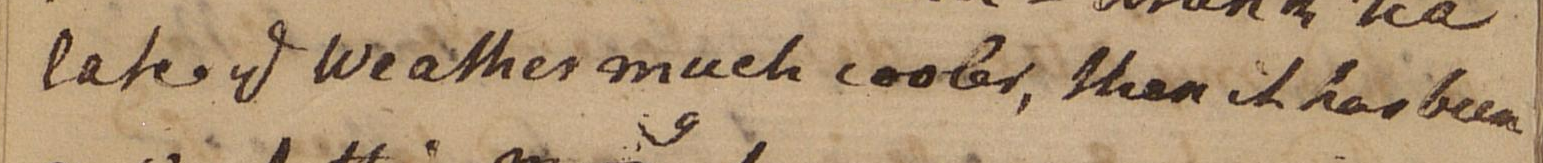late y^e weather much cooler, than it has been
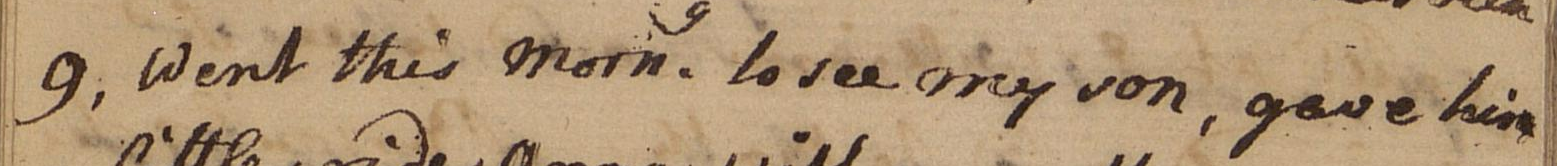9, went this morn^g. to see my son, gave him
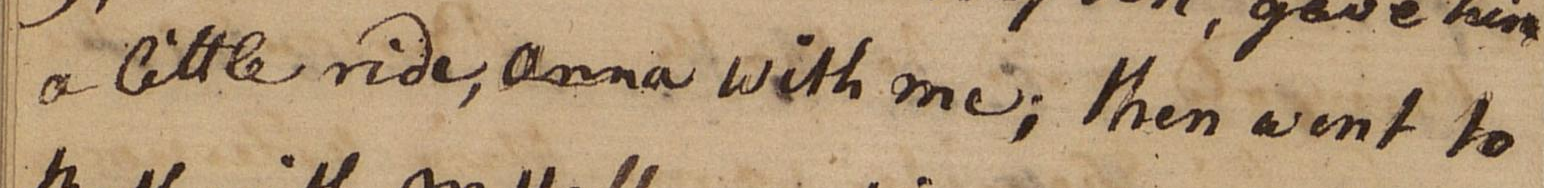a little ride, Anna with me; then went to
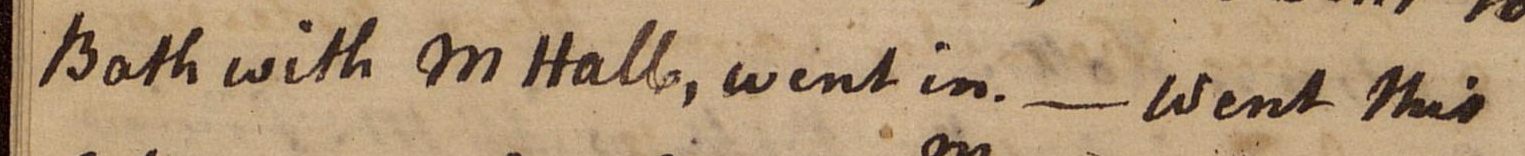Bath with M Hall, went in.- went this
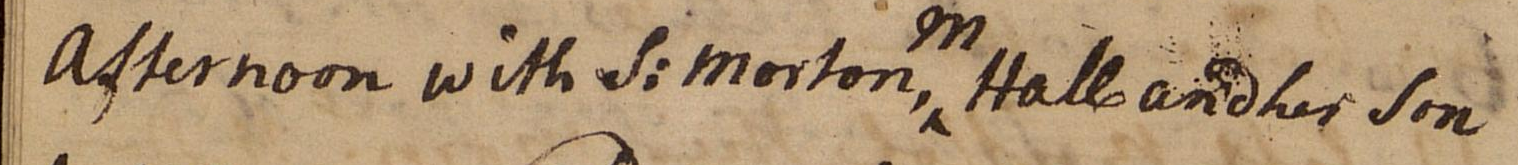Afternoon with S: Morton, ^M Hall and her Son
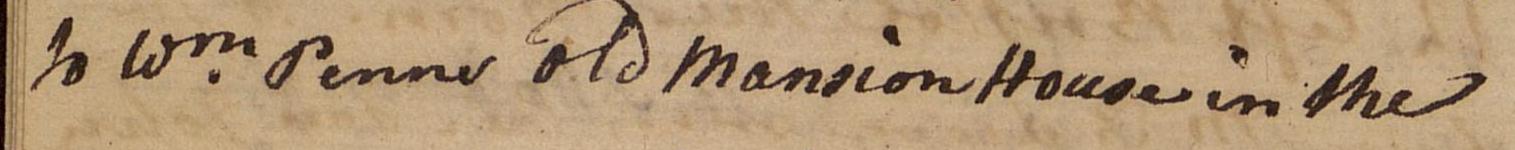to W^m. Penns old Mansion House in the
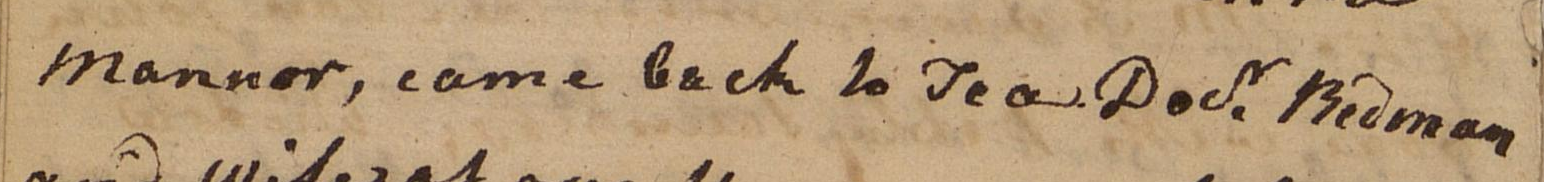manner, came back to Tea. Doc^r. Redman
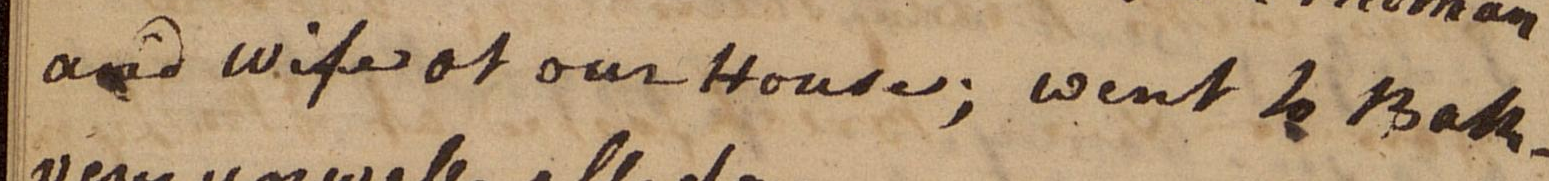and wife of our House; went to Bath
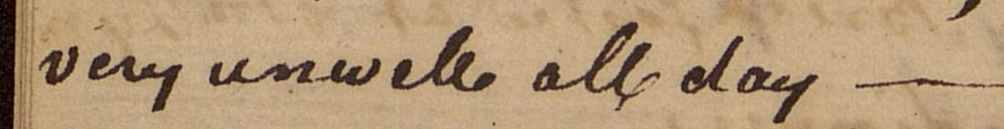very unwell all day-
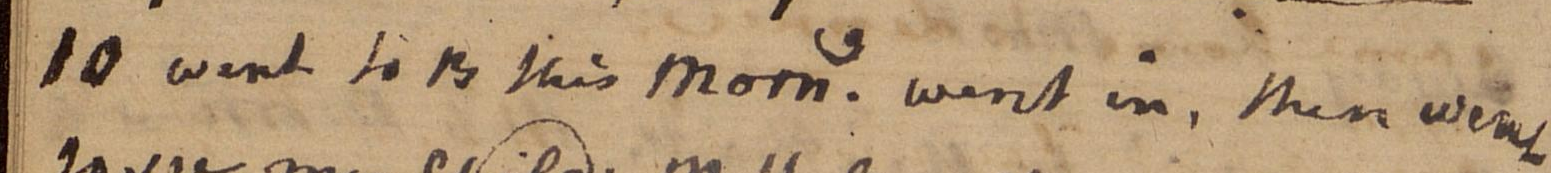10 went to B this Morn^g. went in, then went
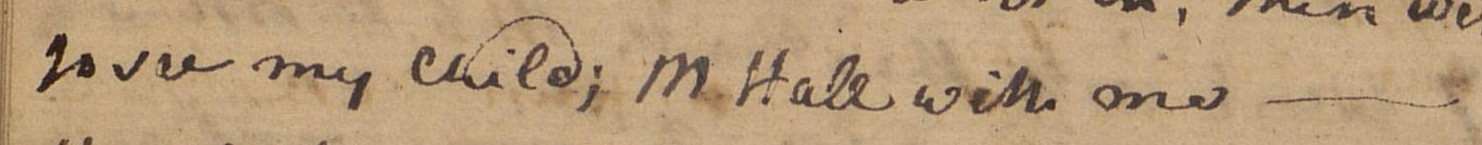to see my Child, M Hall with me-
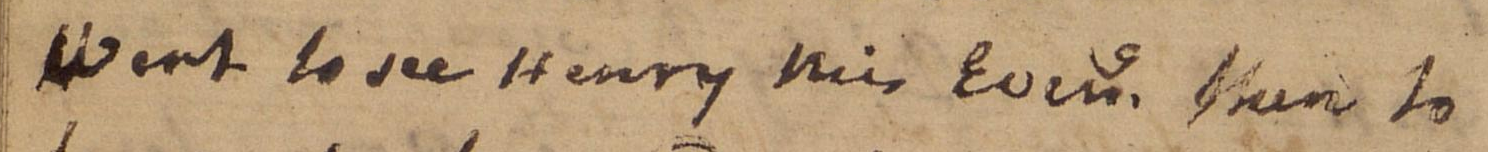Went to see Henry this Even^g. then to
